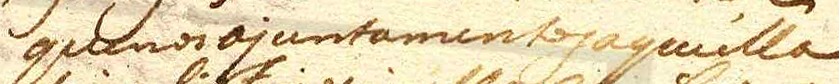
que nos ajuntamentos a que ella
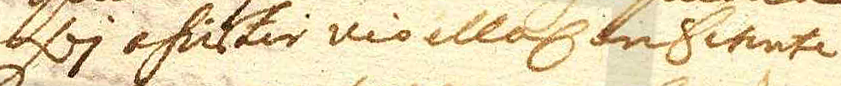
foi assistir vio ella Confitente
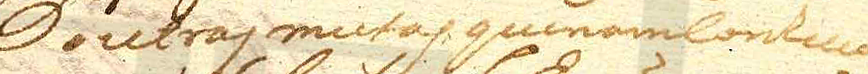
outras mutas que nam conheçeo
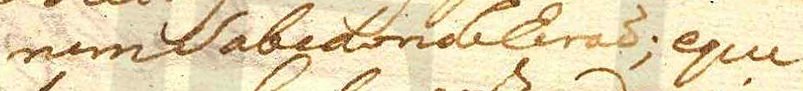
nem Sabe donde heraõ; e que
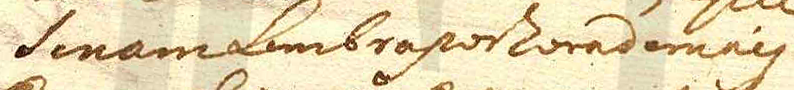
se nam Lembra por hora de mais
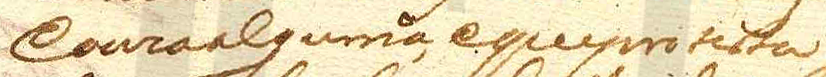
Couza alguma, e que protesta
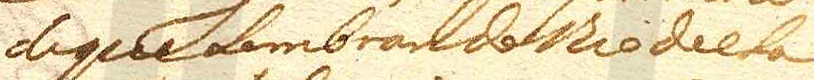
de que Lembrandolhe o decla
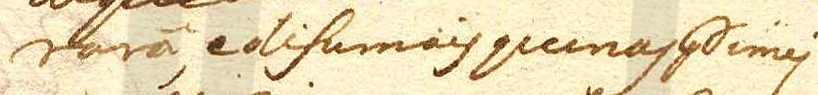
rará, e disse mais que nas primej
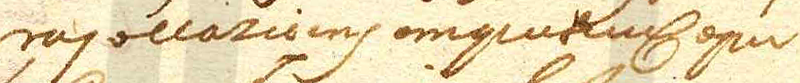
ras occazioens em que teue Copu
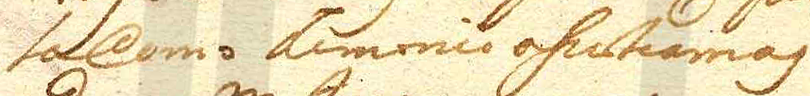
la Com o demonio assistiam as
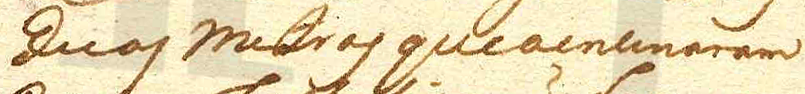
duas mestras que a encinaram
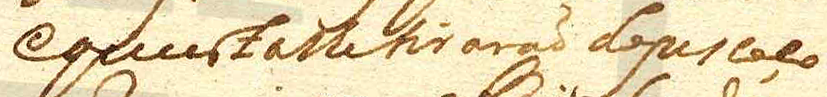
e que esta lhe tiraraõ do pescoço
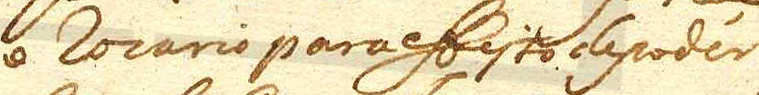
o Rozario para effejto de poder
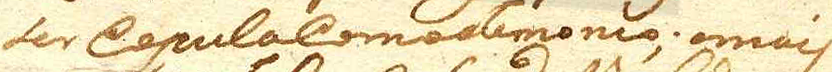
ter Copula com o demonio; e mais
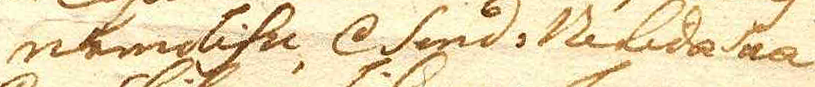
nam disse, e sendo lhe Lida sua
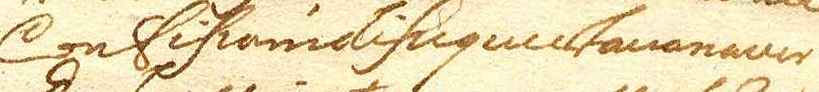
Confissam disse que estaua na ver
